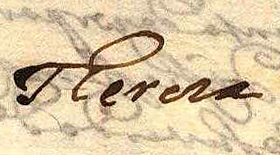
Thereza
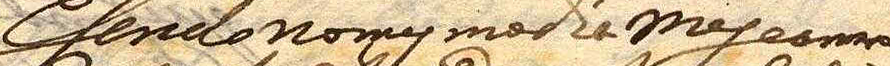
E sendo no mesmo dia mes e anno
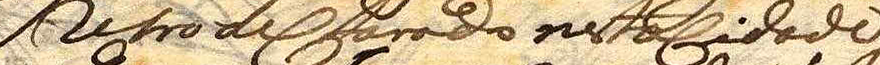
Retro deClarado nesta Cidade
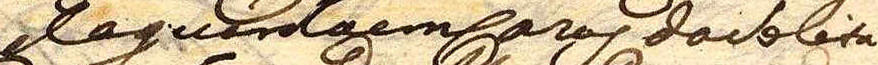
da guarda em Cazas da Solita
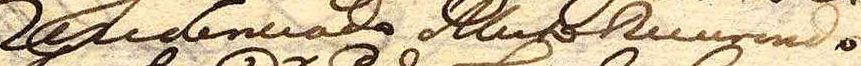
Rezedencia do Muto Reuerendo
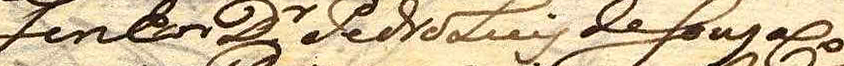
senhor D.r Pedro Luis de souza Co
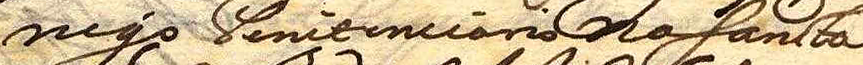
nigo Penitenciario na sancta
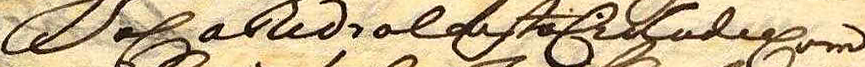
Se Cathedral desta Cidade Com
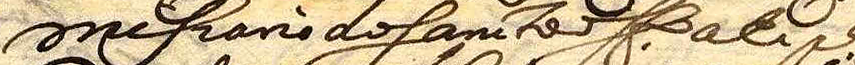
missario do sancto off.o ahi p.a
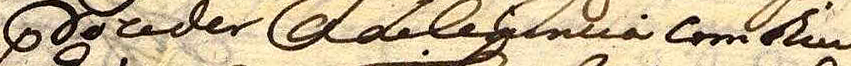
proçeder a deligencia comtheu
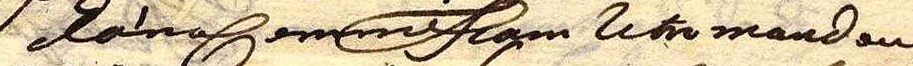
da na Commissam Retro mandou
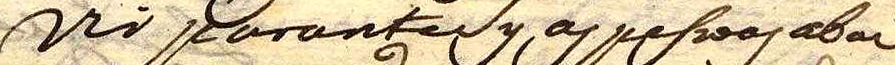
vir parante sy as pessoas abai
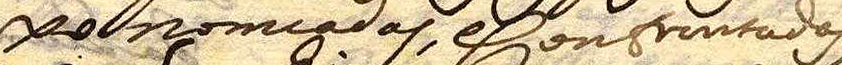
xo nomeadas, e Confrontadas,
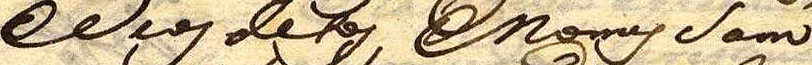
e Seos ditos, e nomes sam
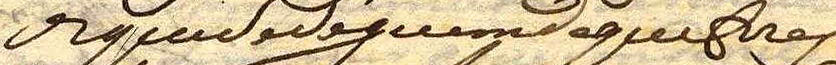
os que se seguem de que fiz es
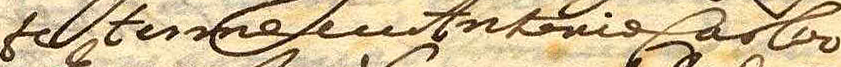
te termo eu Antonio Carlos
